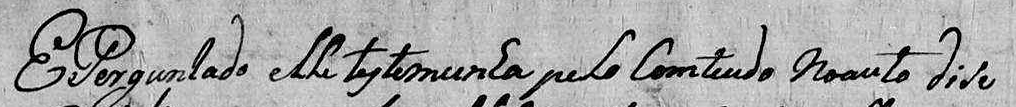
E Perguntado elle testemunha pelo Comteudo no auto dise
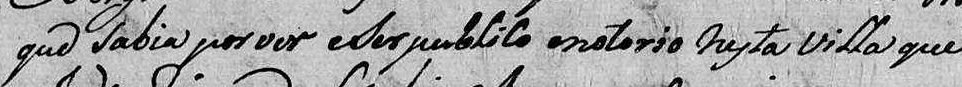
que sabia por ver e Ser publiCo e notorio nesta villa que
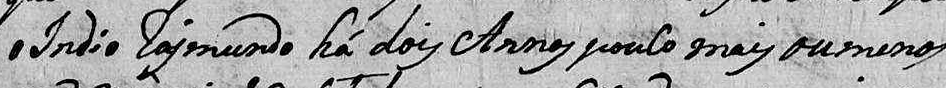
o Indio Rajmundo há dois Annos pouCo mais ou menos
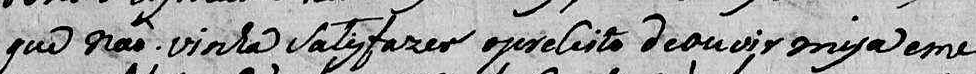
que naõ. vinha satisfazer o preCeito de ouvir misa e me
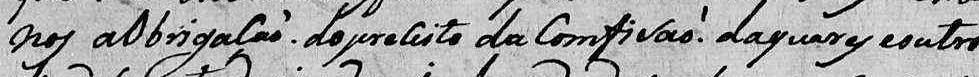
nos a ObrigaÇaõ. do preCeito da Confisaõ. da quares e outro
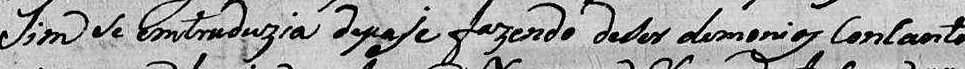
Sim se emtruduzia de paje fazendo de ser demonios con Canto
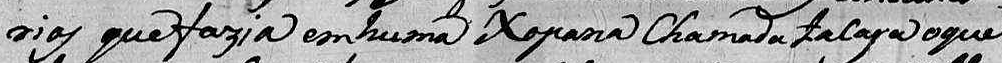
rias que fazia em huma Xopana Chamada taCaya o que
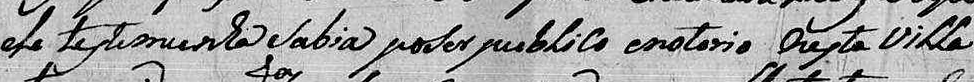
ele testemunha sabia po ser publiCo e notorio nesta villa
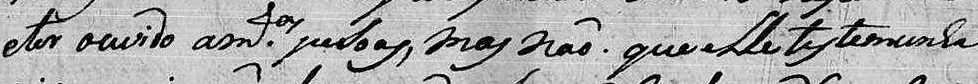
e ter ouvido a m.tas peSoas, mas naõ. que elle testemunha
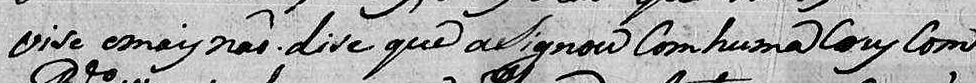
vise e mais naõ. dise que aSignou Com huma Crus Com
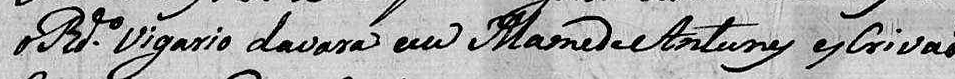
o Rd.o Vigario da vara e eu Mamede Antunes esCrivaõ.
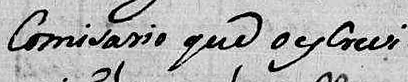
Comisario que o esCrevi.
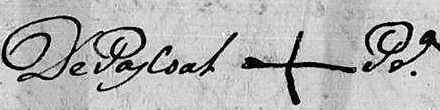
De PasCoal + Pr.a
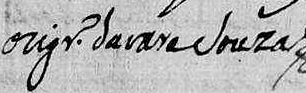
o vigr.o da vara Souza
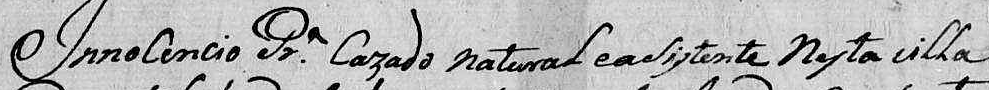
InnoCencio Pr.a Cazado natural e asistente nesta villa
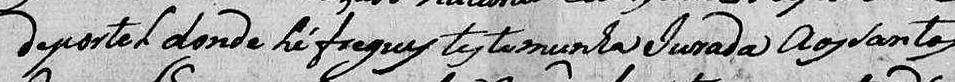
de portel donde hé fregues testemunha Iurada aos santos
